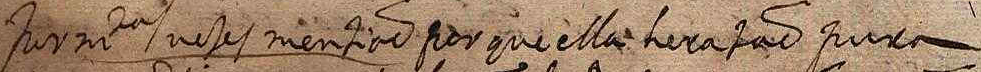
por mtas uezes mentiaõ porque ella hera taõ pura
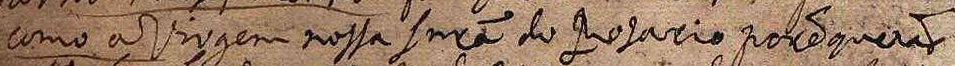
como a Virgem nossa snrā do Rozario porē que naõ
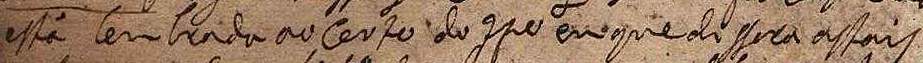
está lembrada ao certo do tpo en que dissera as tais
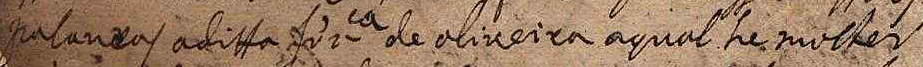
palauras a ditta frnca de oliueira a qual he molher
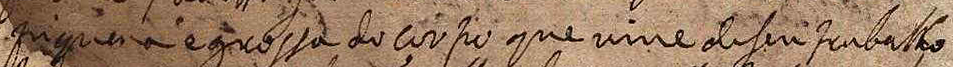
piquena e grossa de corpo que uiue de seu trabalho
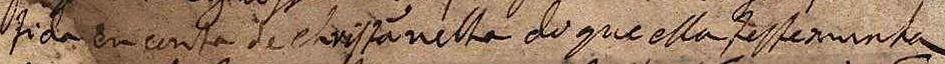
tida em conta de christã uelha do que ella testemunha
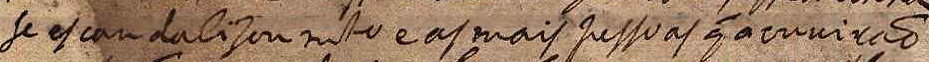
se escandalizou mto e as mais pessoas q̄ a ouuiraõ
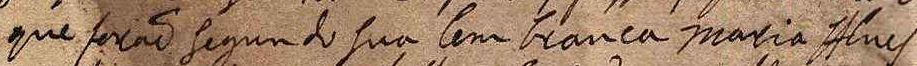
que foraõ segundo sua lembrança maria Alues
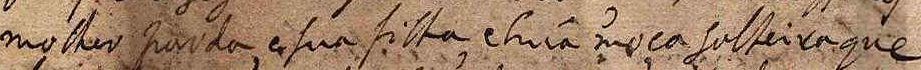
molher parda e sua filha, e huã moça solteira que
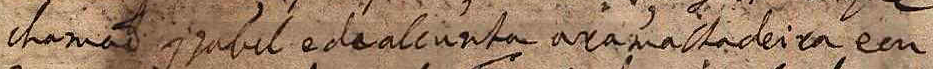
chamaõ jsabel e de alcunha a ramalhadeira e ou
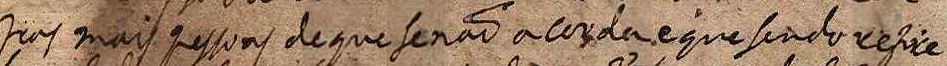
tras mais pessoas de que se não acorda e que sendo repre
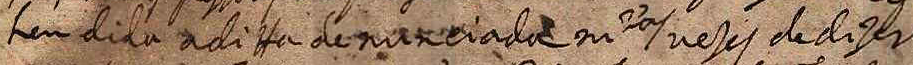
hendida a ditta denunciada mtas uezes de dizer
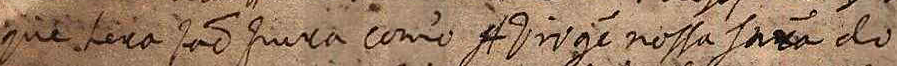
que hera taõ pura como A Virgē nossa Snrā do
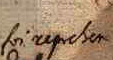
foi reprehen
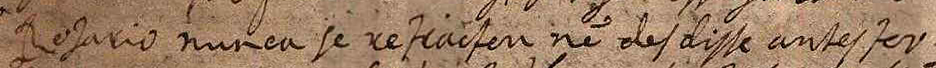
Rozario nunca se retractem nē desdisse antes tor
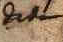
dida
